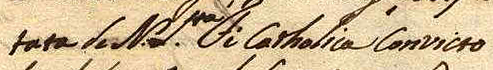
tata de N. S.ta Fé Catholica Convicto
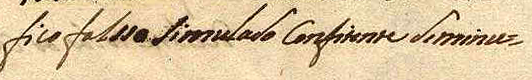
fico falsso simulado Confitente deminu
